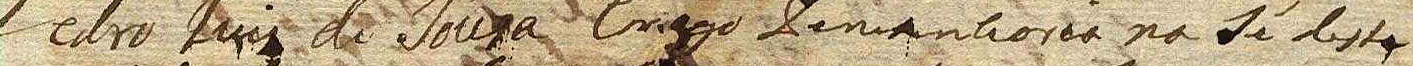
Pedro Luis de Sousa Conego Penitenciario na Sé desta
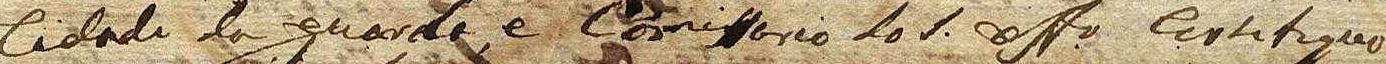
Cidade da Guarda, e Comissario do s. off.o Certefiquo
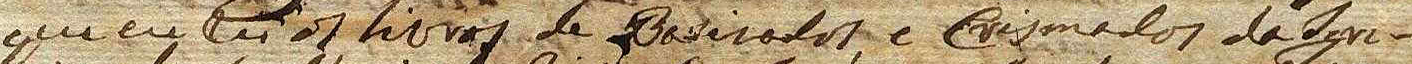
que eu li os livros de Batizados, e Crismados da Igre
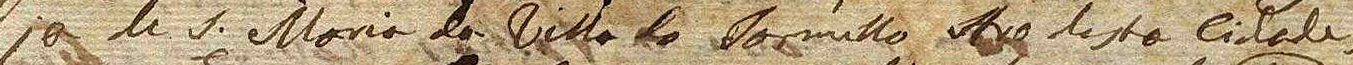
ja de S. Maria da Villa do Iarmello Aro desta Cidade,
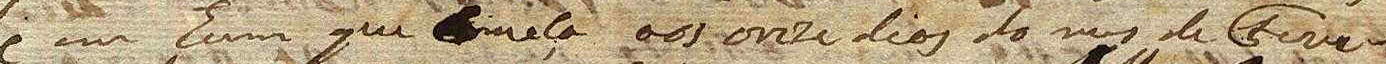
e em hum que Começa aos onze dias do mes de Feve
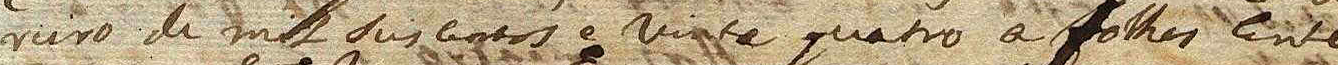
reiro de mil seiscentos e vinte quatro a folhas cento
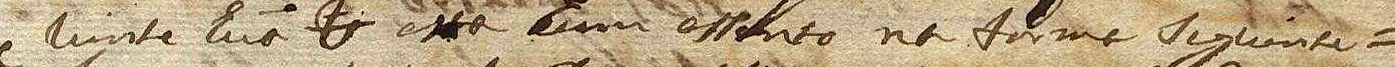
e vinte huā V̄ esta hum assento na forma seguinte
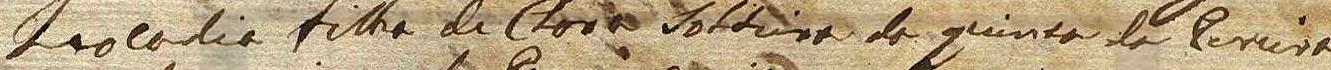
Leocadia filha de Clara solteira da quinta da Pereira
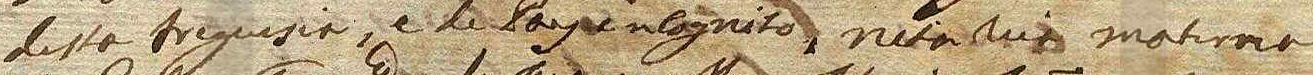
desta freguesia, e de Pay incognito, neta via materna
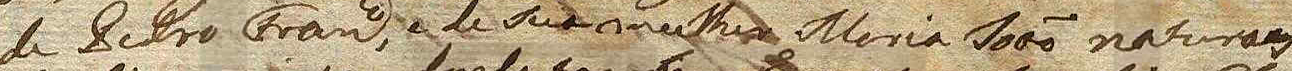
de Pedro Fran,co e de sua mulher Maria Ioaõ naturaes
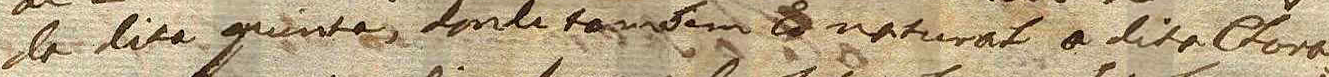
da dita quinta, donde tambem he natural a dita Clara,
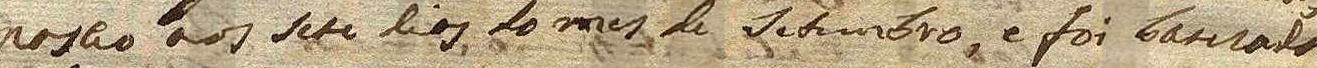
nasceo aos sete dias do mes de Setembro, e foi batizada
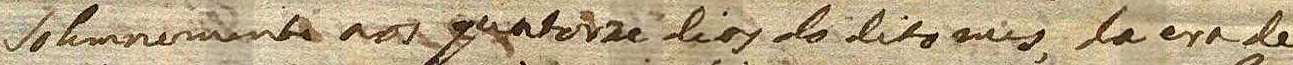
Solemnemente aos quatorze dias do dito mes, da era de
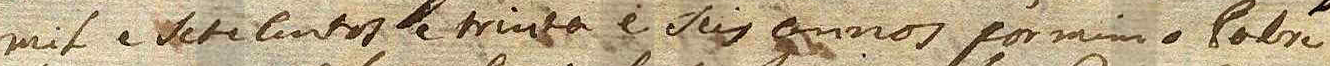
mil e setecentos e trinta e seis annos por mim o Padre
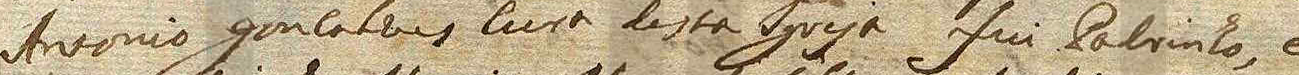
Antonio goncalves Cura desta Igreja fui Padrinho, e
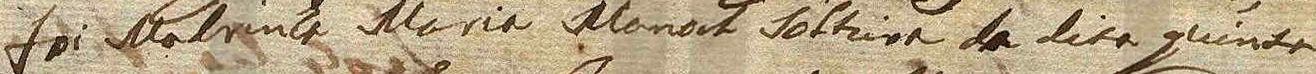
foi Madrinha Maria Manoel solteira da dita quinta,
